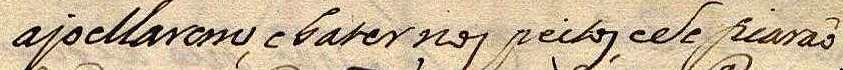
ajoelharem, e bater nos peitos, e se ficaraõ,
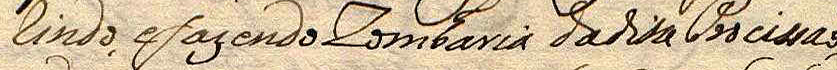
Rindo, e fazendo Zombaria da dita Procissaõ,
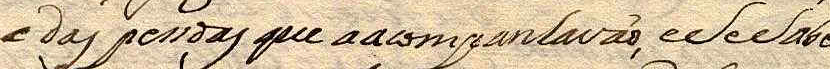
e das pessoas que a acompanhavaõ, e se sabe
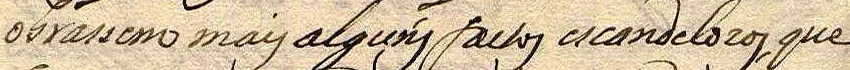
obrassem mais alguns factos escandelozos, que
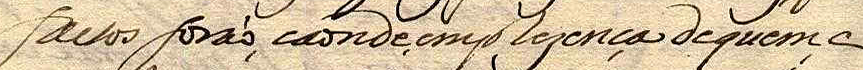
factos foraõ, e aonde, em prezença de quem, e
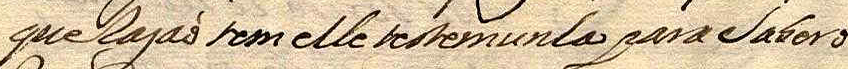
que Razaõ tem elle testemunha para saber o
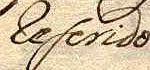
Referido.
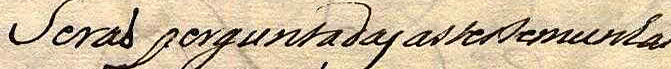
Seraõ perguntadas as testemunhas
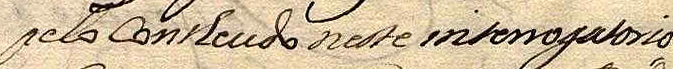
pelo contheudo neste interrogatorio,
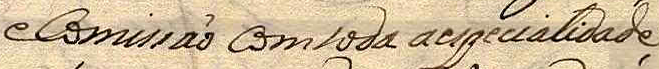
e Comissaõ com toda a especialidade,
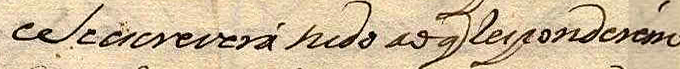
de se escreverá tudo ao q̄ Responderem
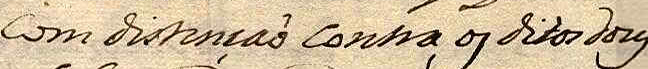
com distinçaõ contra os ditos dous
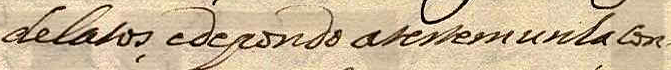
delatos, e depondo a testemunha con
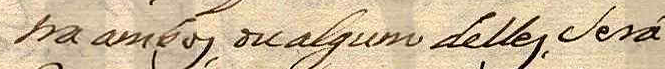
tra ambos, ou algum, delles, será
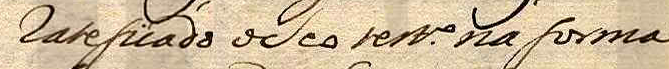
Rateficado o seo test.o na forma
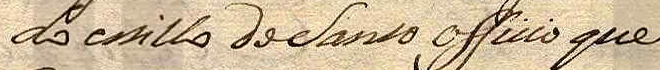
do estillo do Santo officio que
